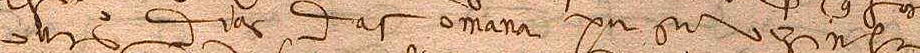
outos dias da somana por ser vezinha
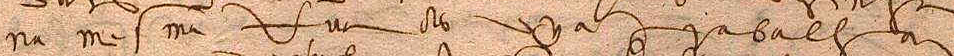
na mesma Rua As vya trabalhar
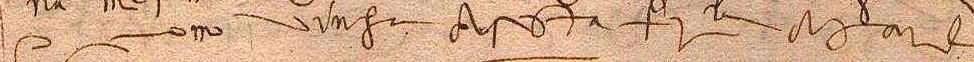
e como vinha A sesta frra A tarde
